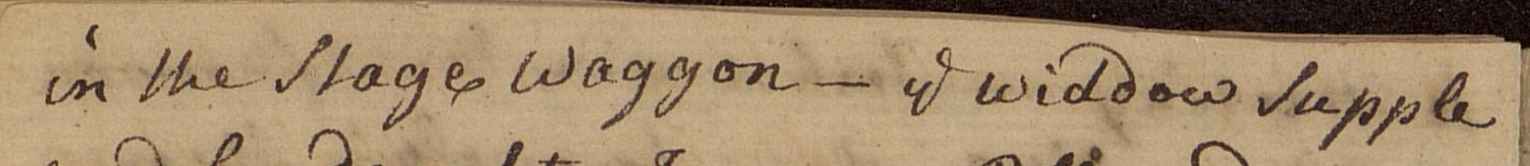in the Stage Waggon- y^e widdow supple
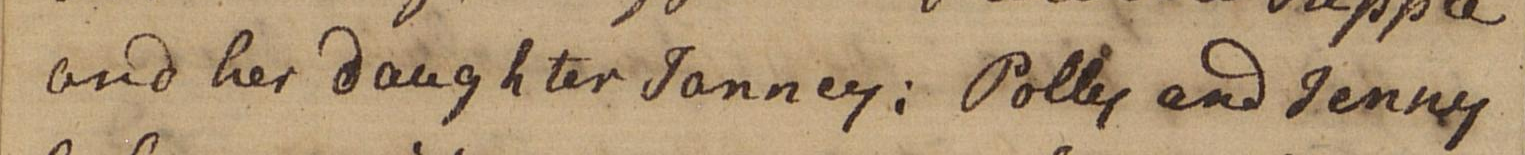and her daughter Janney; Polly and Jenny
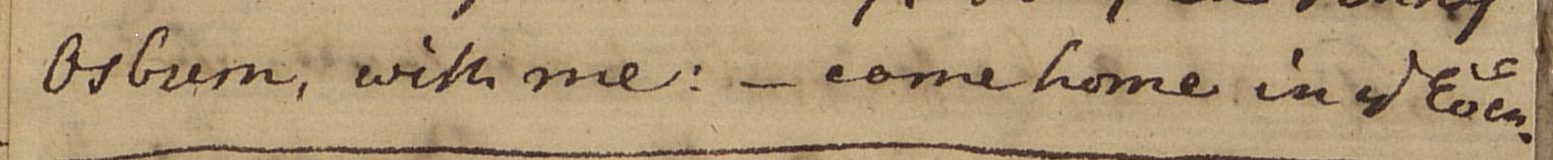Osburn, with me:- came home in y^e Even^g.
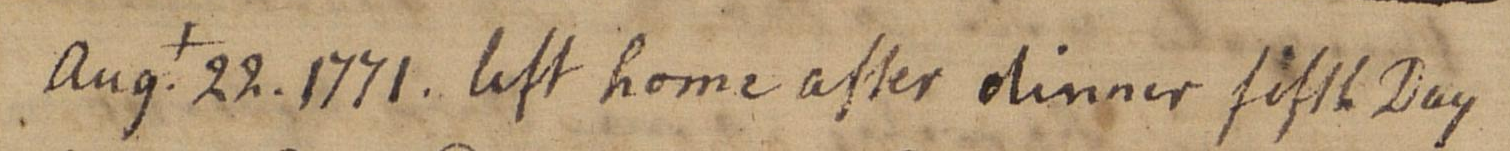Aug^t. 22. 1771. left home after dinner fifth Day
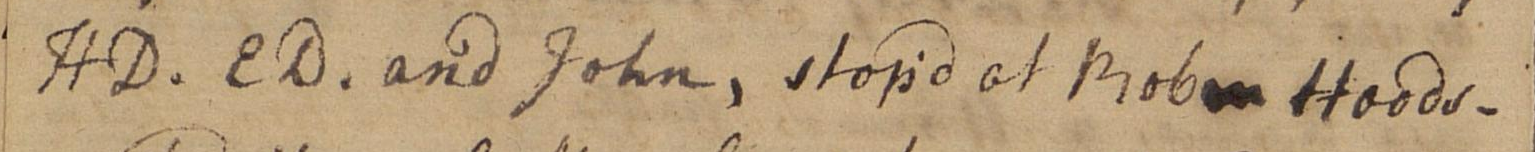HD. ED. and John, stop'd at Rob[__] Hoods.
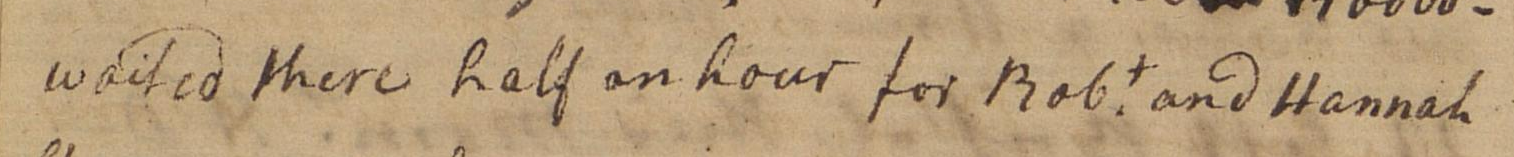waited there half an hour for Rob^t. and Hannah
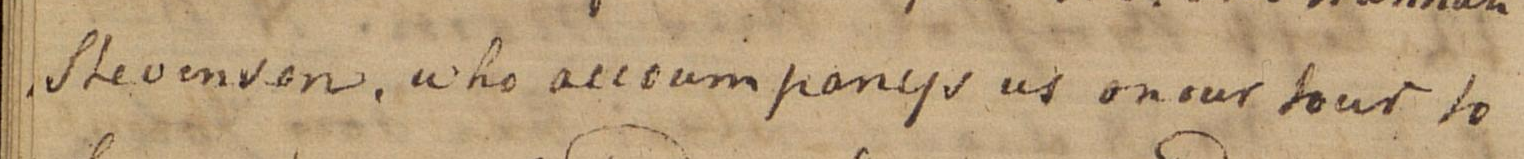Stevenson, who accoumpanys us on our tour to
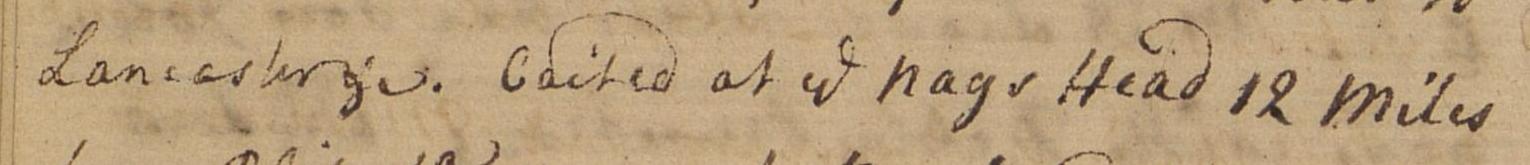Lancaster &c. Caited at y^e hags Head 12 Miles
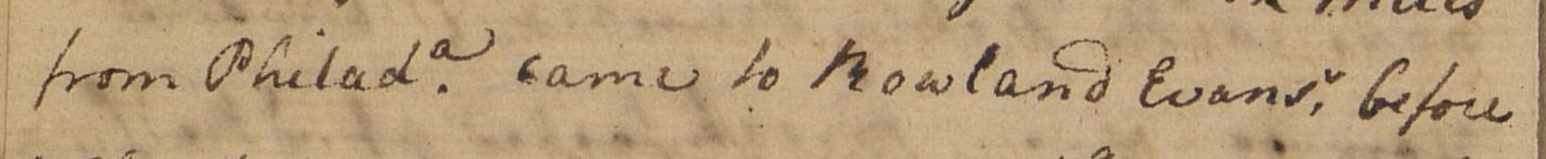from Philad^a. came to Rowland Evans^s. before
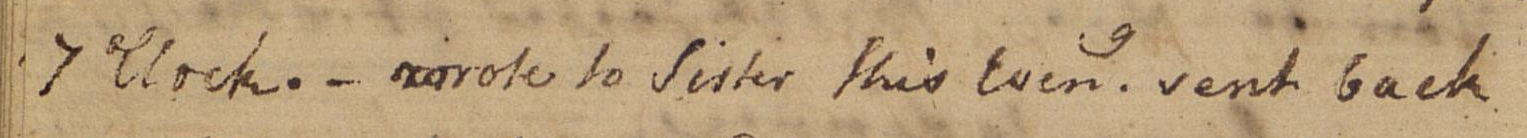7 oClock. - wrote to Sister this Even^g. sent back
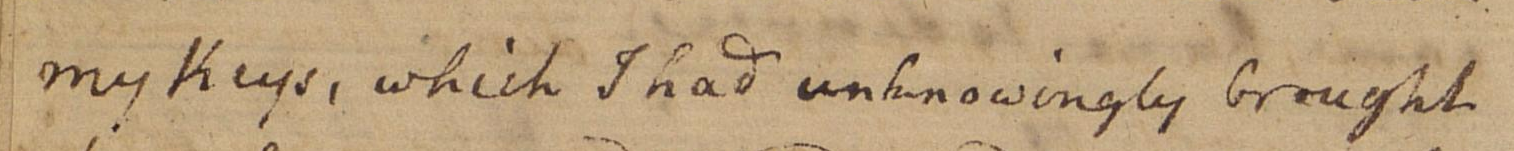my keys, which I had unknowingly brought
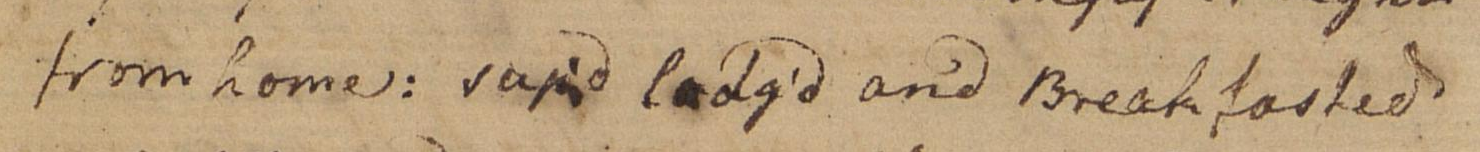from home: sup'd lodg'd and Breakfasted
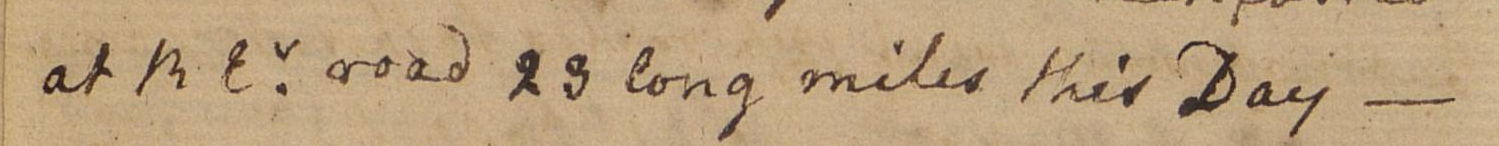at RE^v. road 23 long miles this Day-
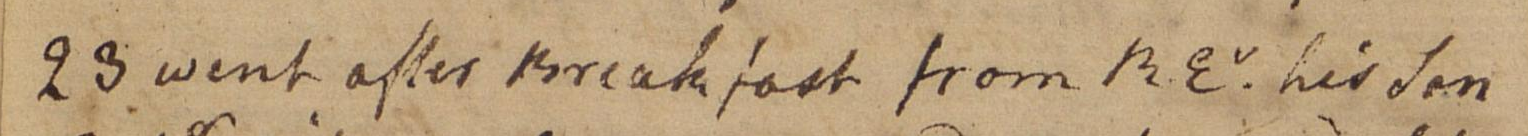23 went after Breakfast from RE^v. his Son
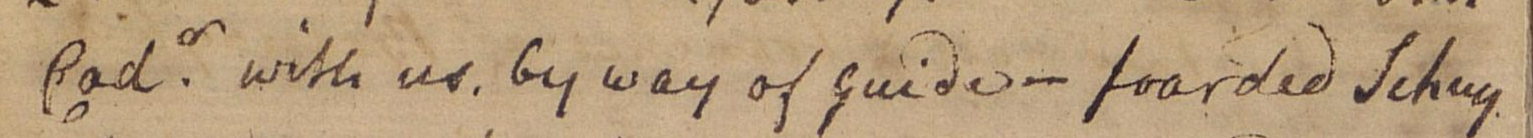Cad^r. with us. by way of guide- foarded Schuy
